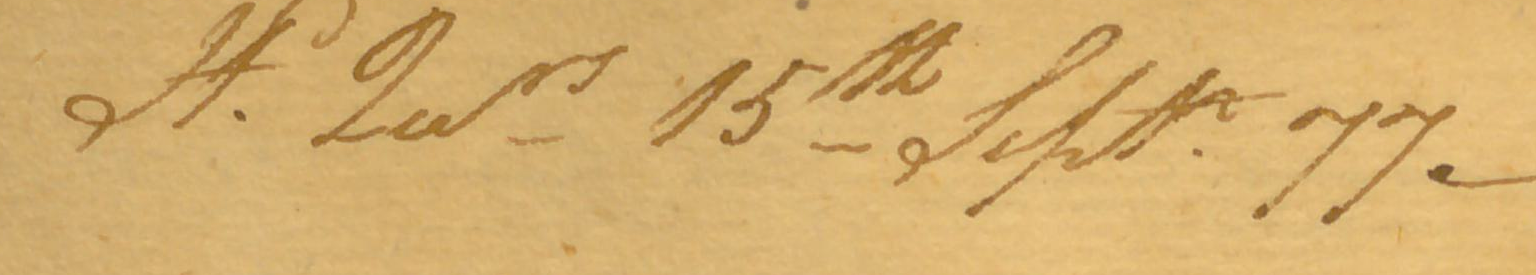H^d. Qu^rs 15^th Sept^r. 77-
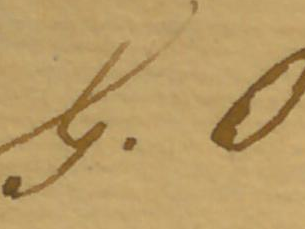G.O
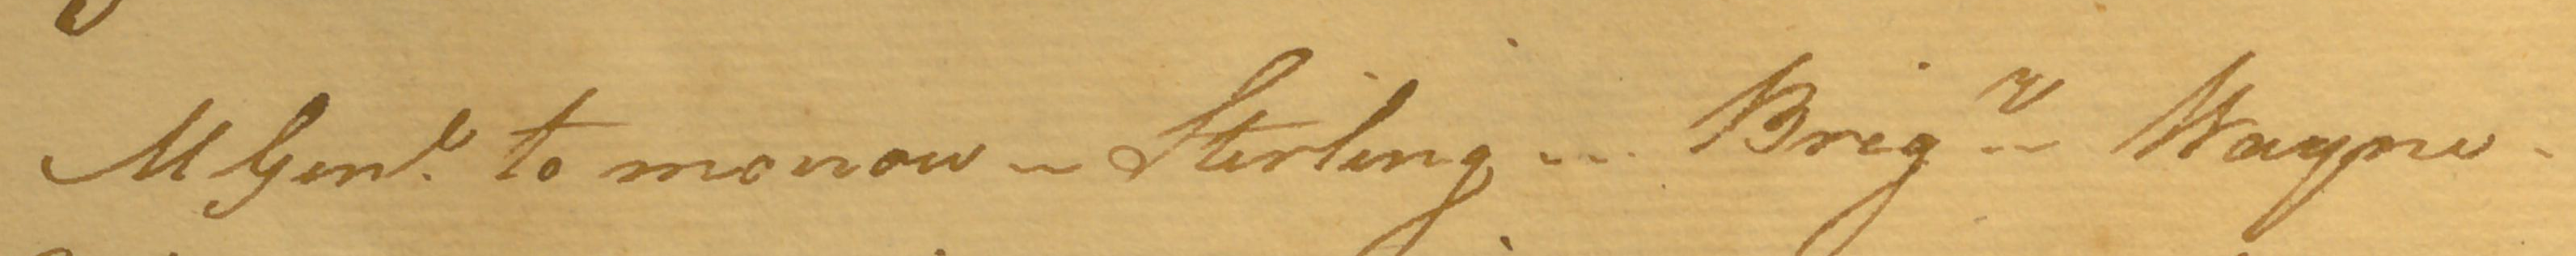M Gen^l. to morrow- Stirling.. Brig^r Wayne
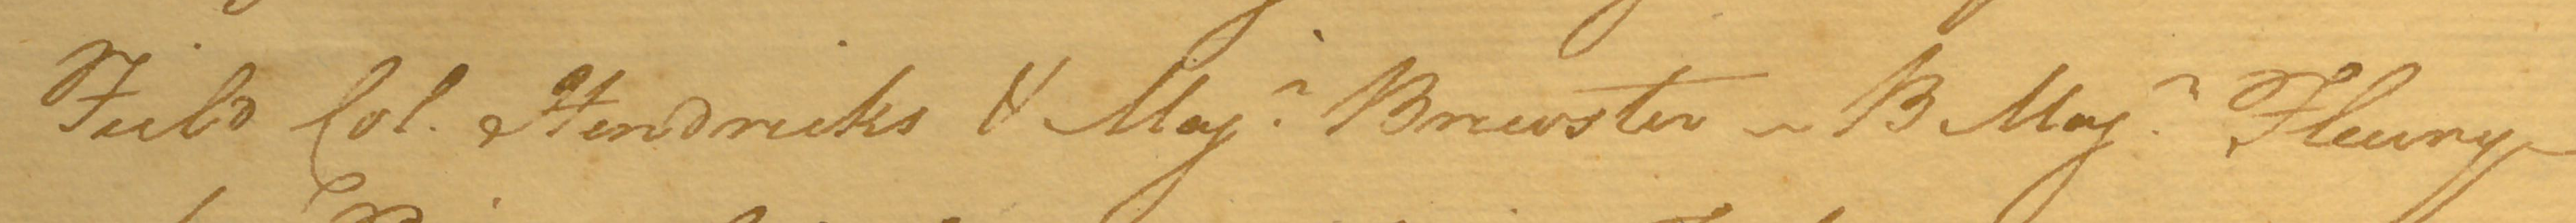Field Col. Hendricks & Maj^r. Brewster- B Maj^r. Fleury
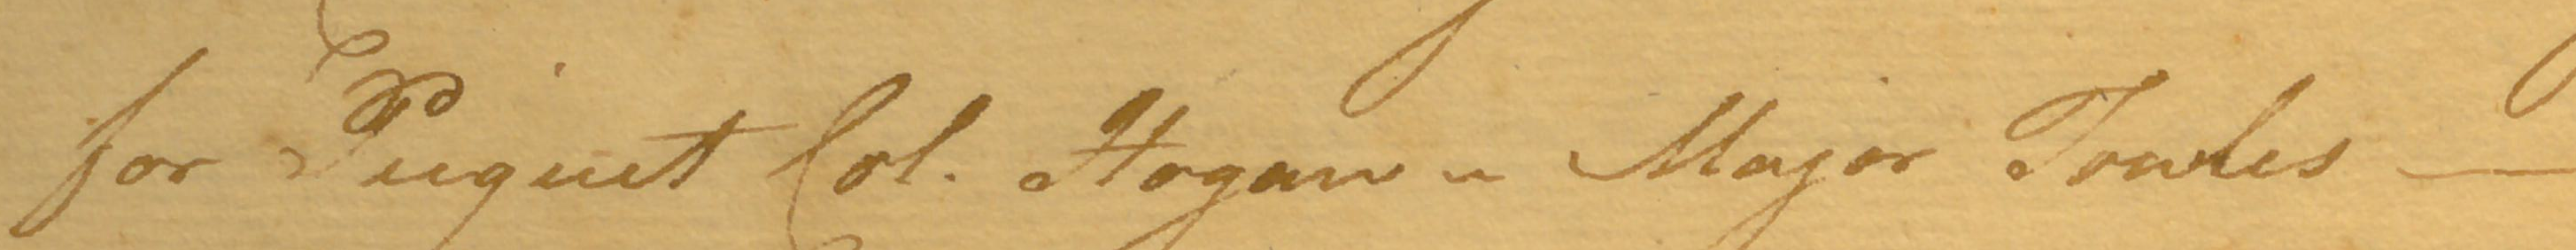for Picquet Col. Hogan- Major Towles
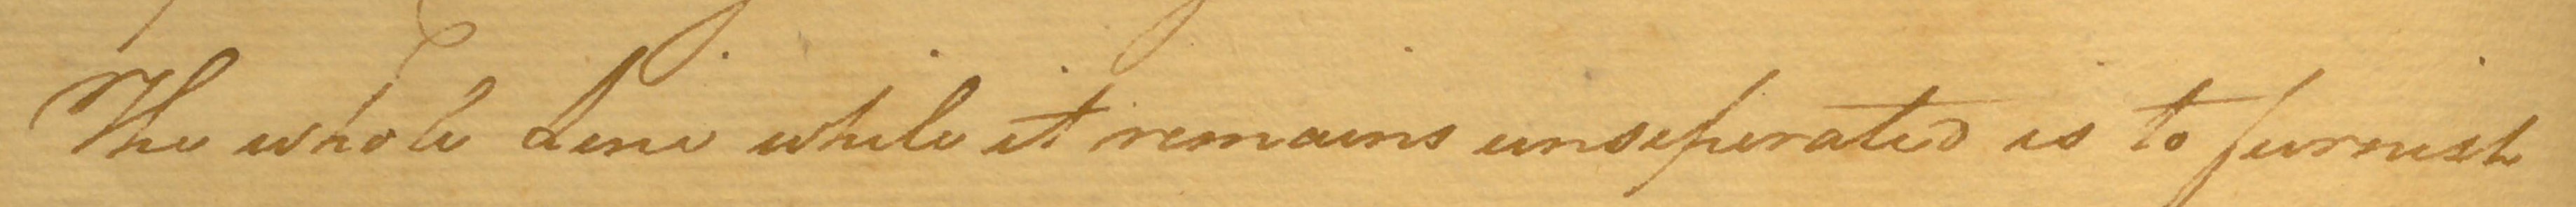The whole Line while it remains unseperated is to furnish
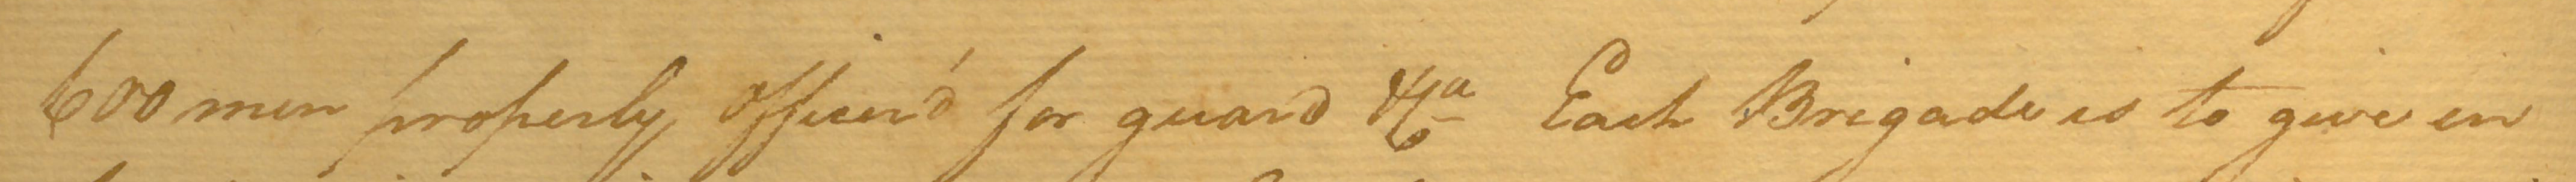600 men properly officer'd for guard &c^a Each Brigade is to give in
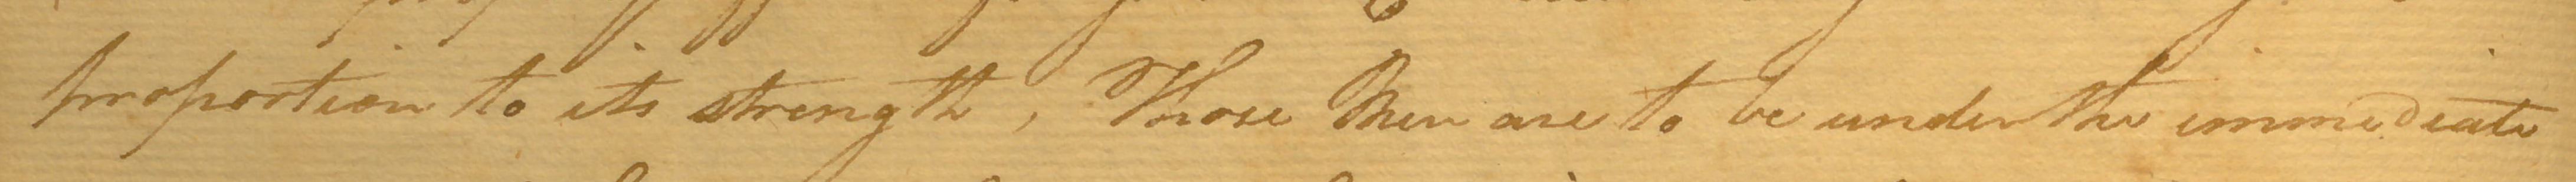proportion to its strength. Those Men are to be under the immediate
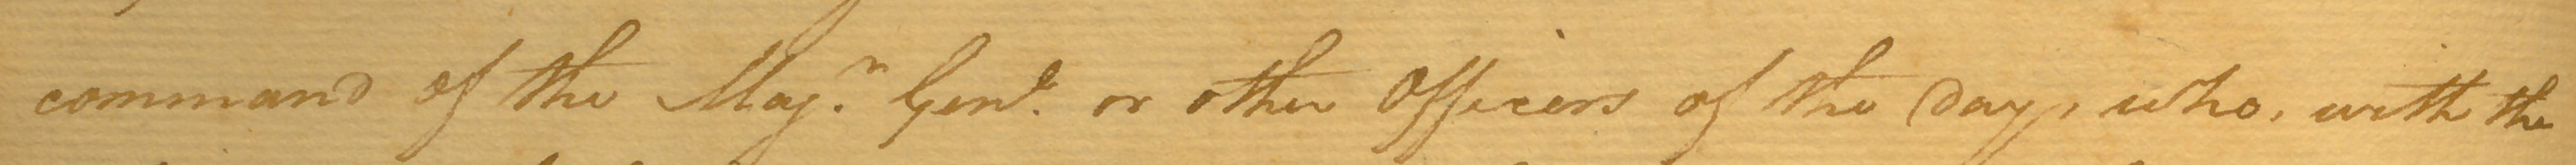command of the Maj^r. Gen^l. or other Officers of the day, who, with the
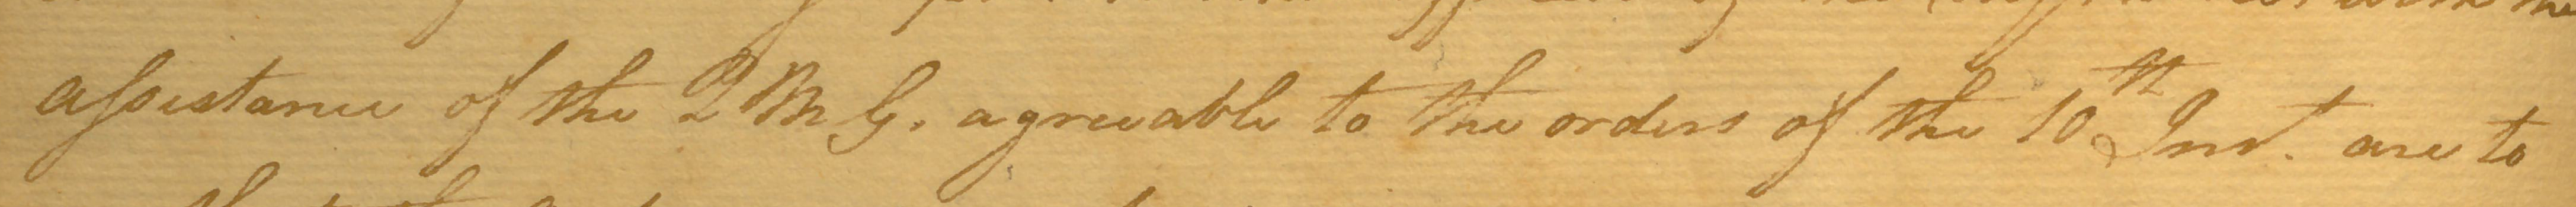assistance of the QMG. agreeable to the orders of the 10^th Inst^t. are to
